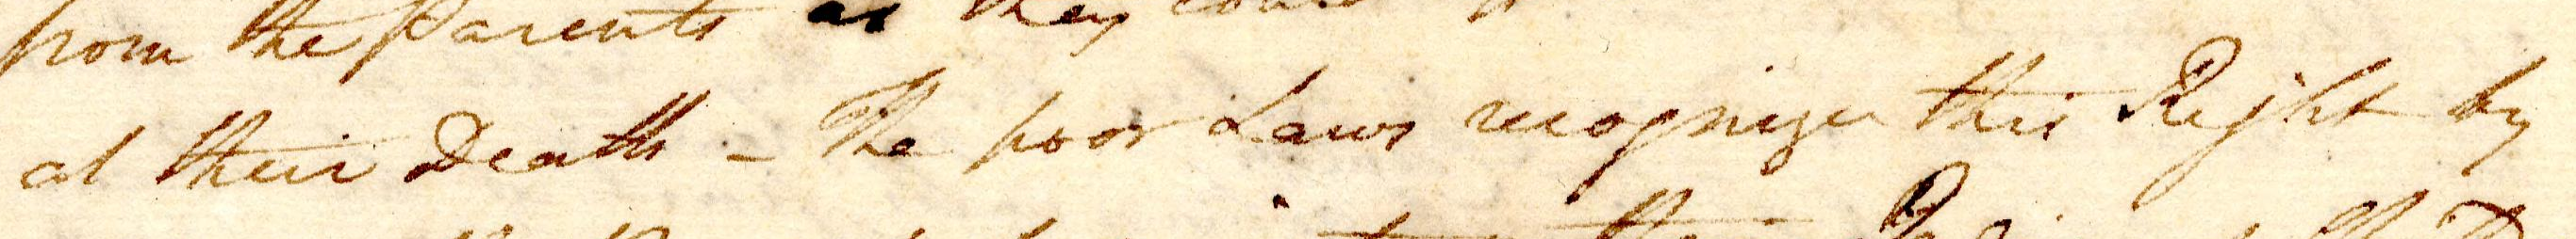at their Deaths. The poor Laws recognize this Right by
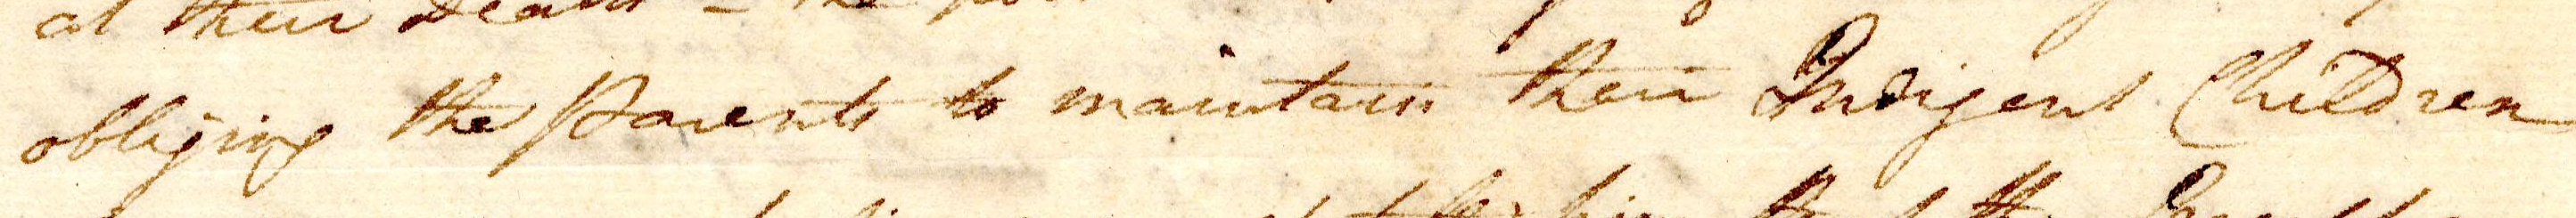obliging the Parents to maintain their Indigent Children
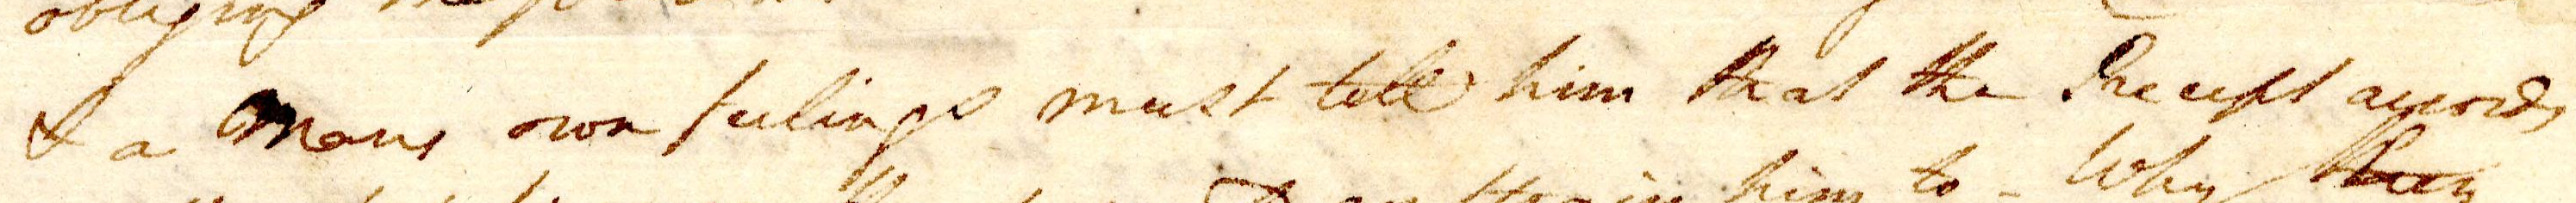& a mans own feelings must tell him that the Precept accords
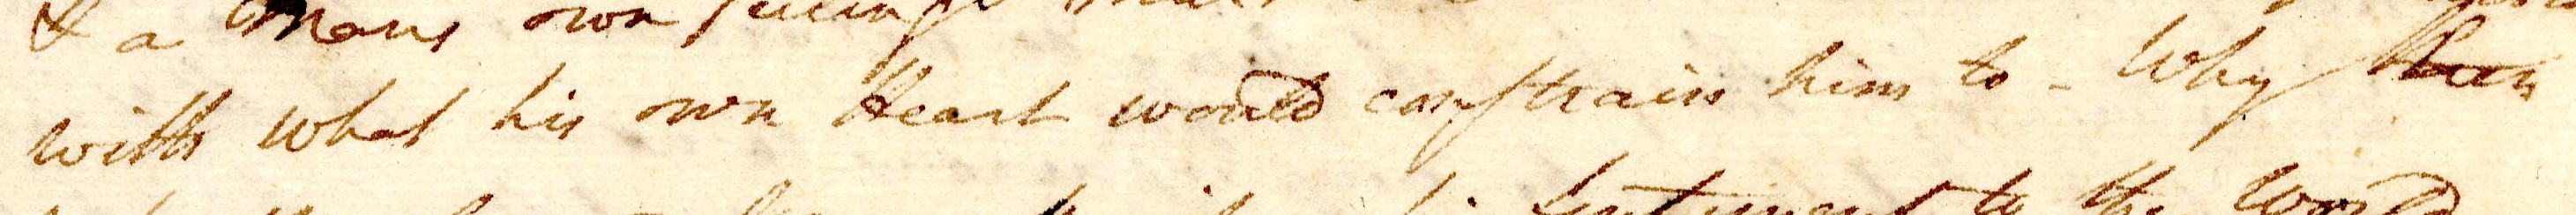with what his own Heart would constrain him to. Why then
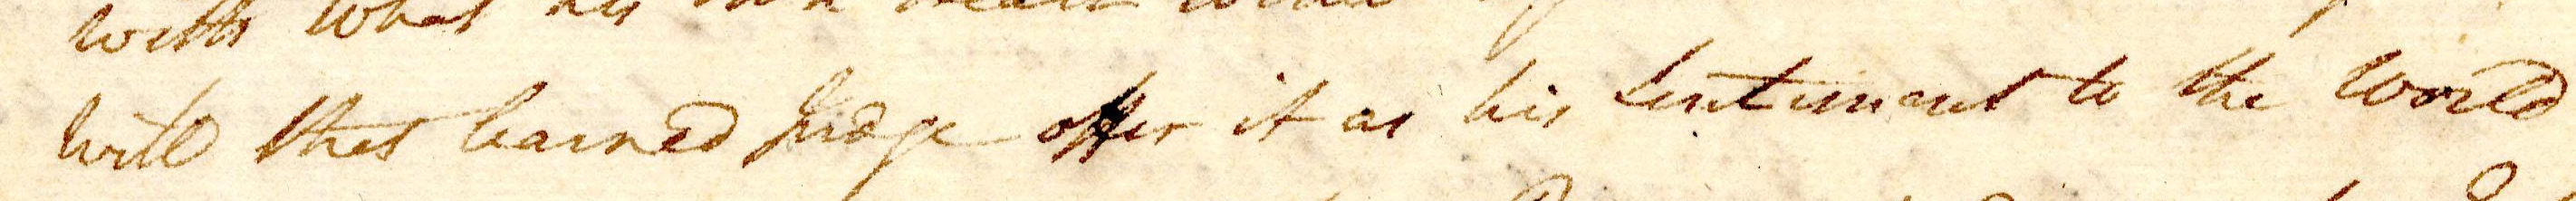will that learned Judge offer it as his Sentiment to the world
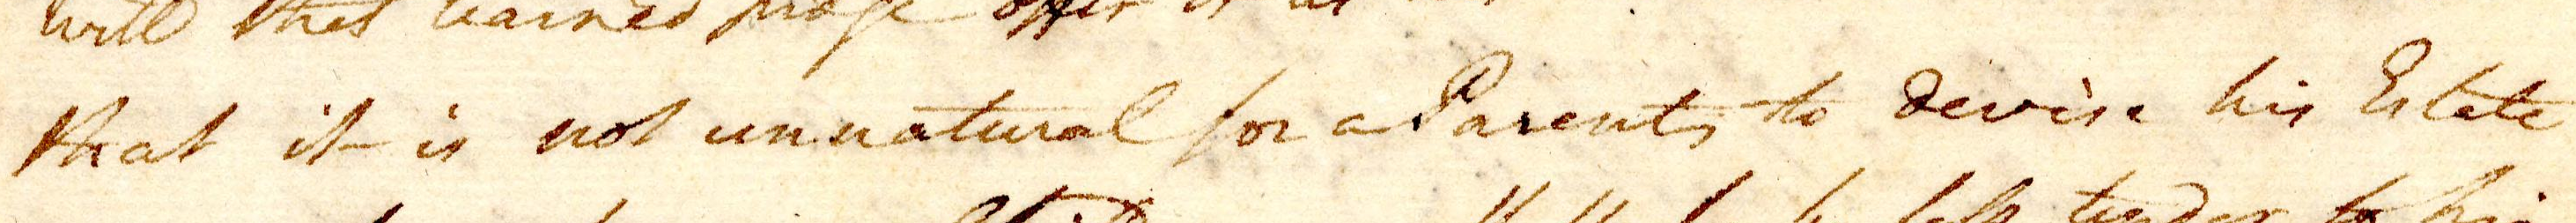that it is not unnatural for a Parent to devise his Estate
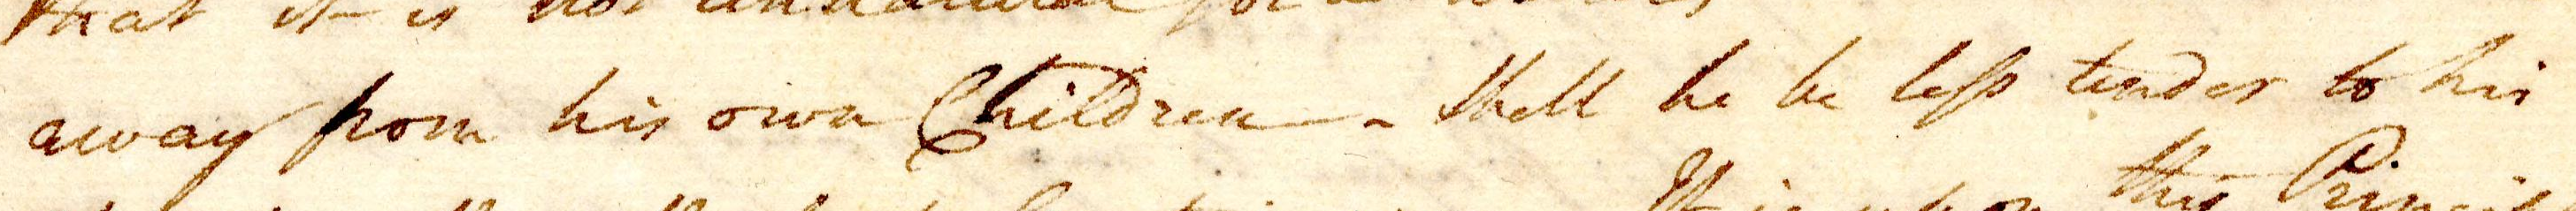away from his own Children. shall he be less tender to his
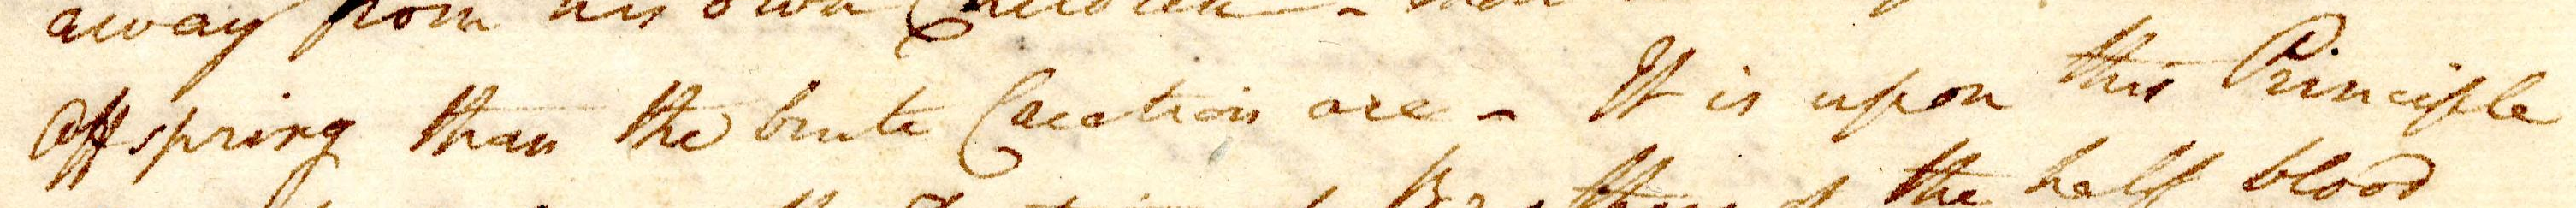offspring than the brute Creation are- It is upon this Principle
